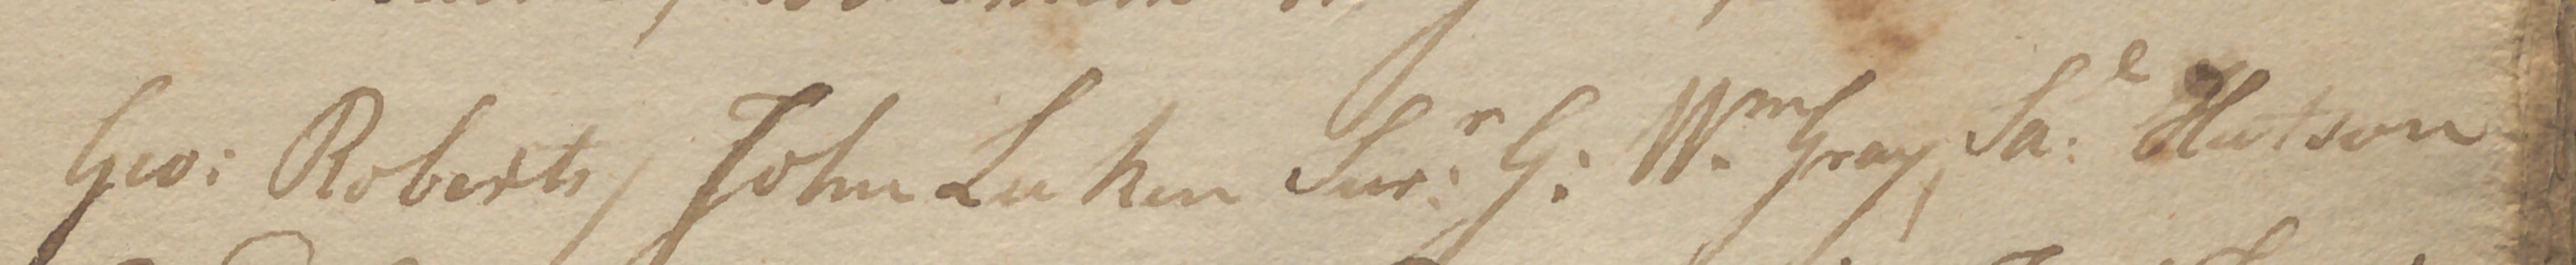Geo: Roberts, John Luken Sen^r. G. W^m. Gray Sa^l. Hutson
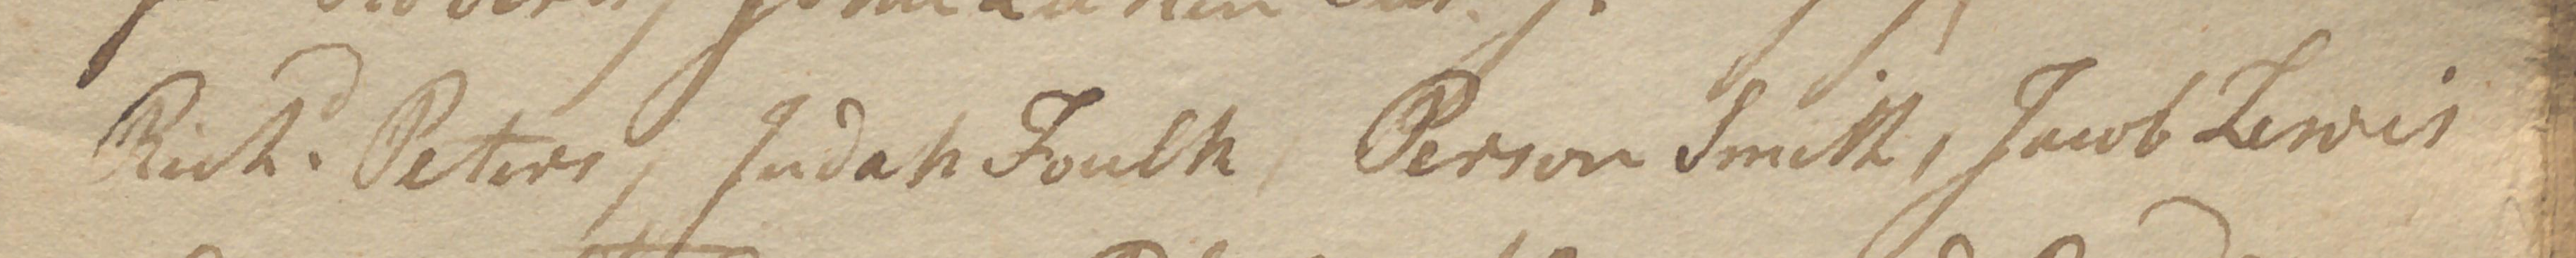Rich^d. Peters, Judah Foulk, Person Smith, Jacob Lewis
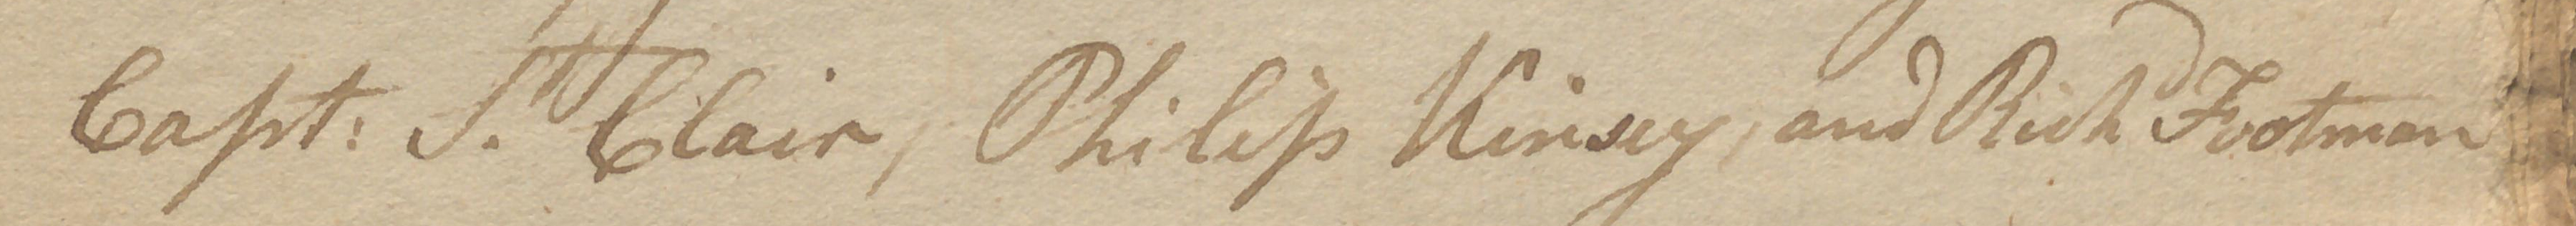Capt: S^t. Clair, Philip Kinsey and Rich^d Footman.
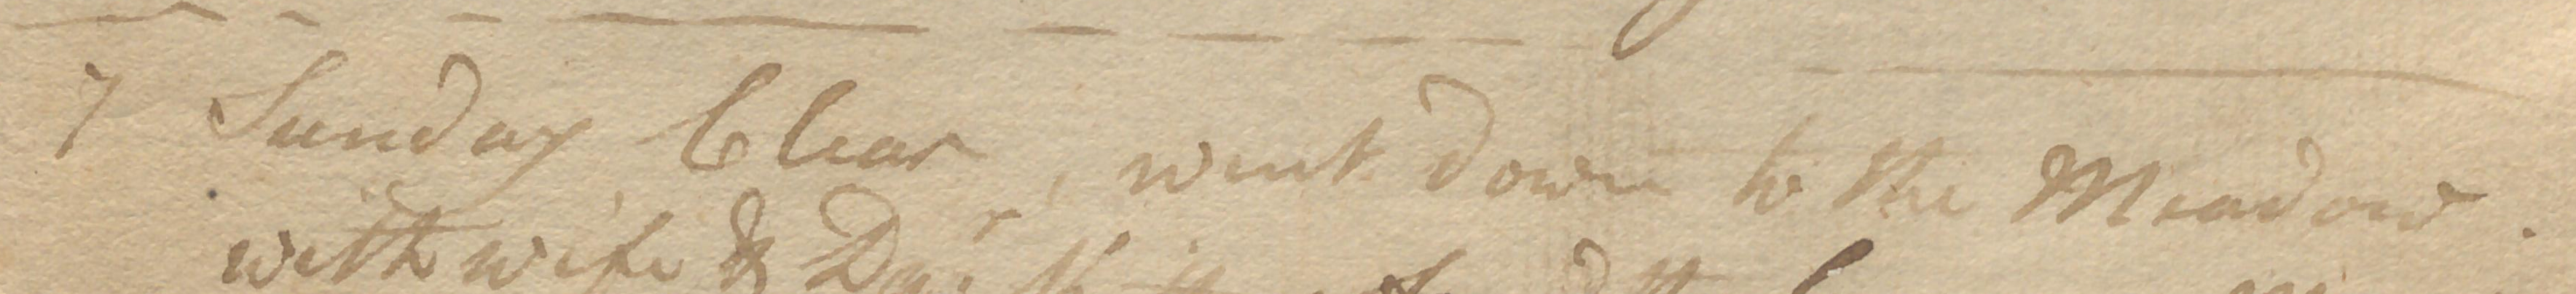7 Sunday Clear went down to the Meadow
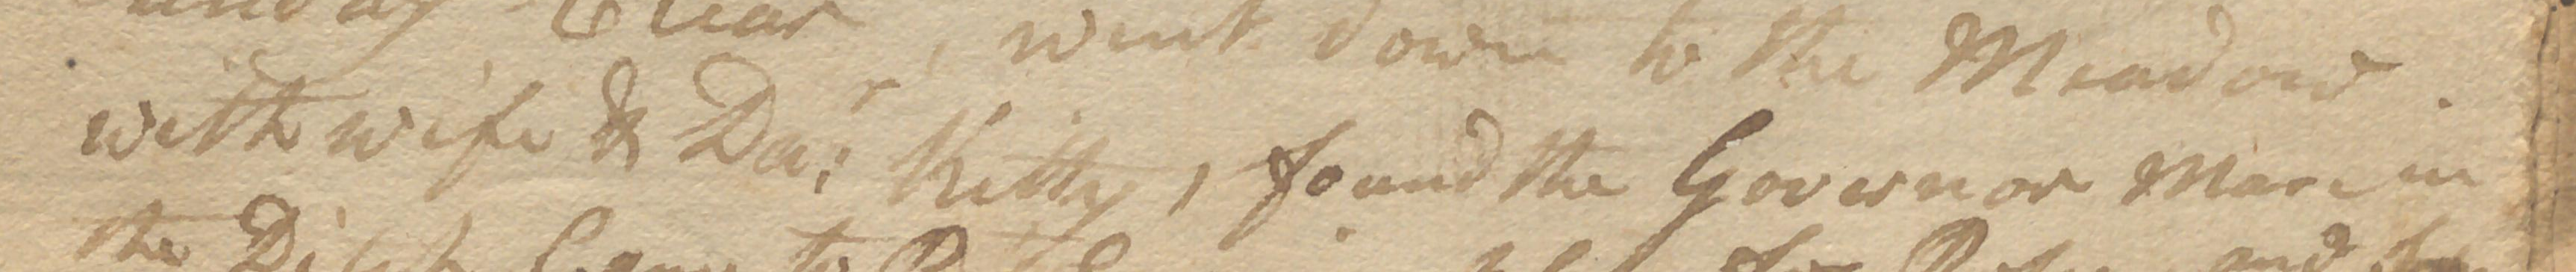with wife & Da^r: Kitty found the Governor Mare in
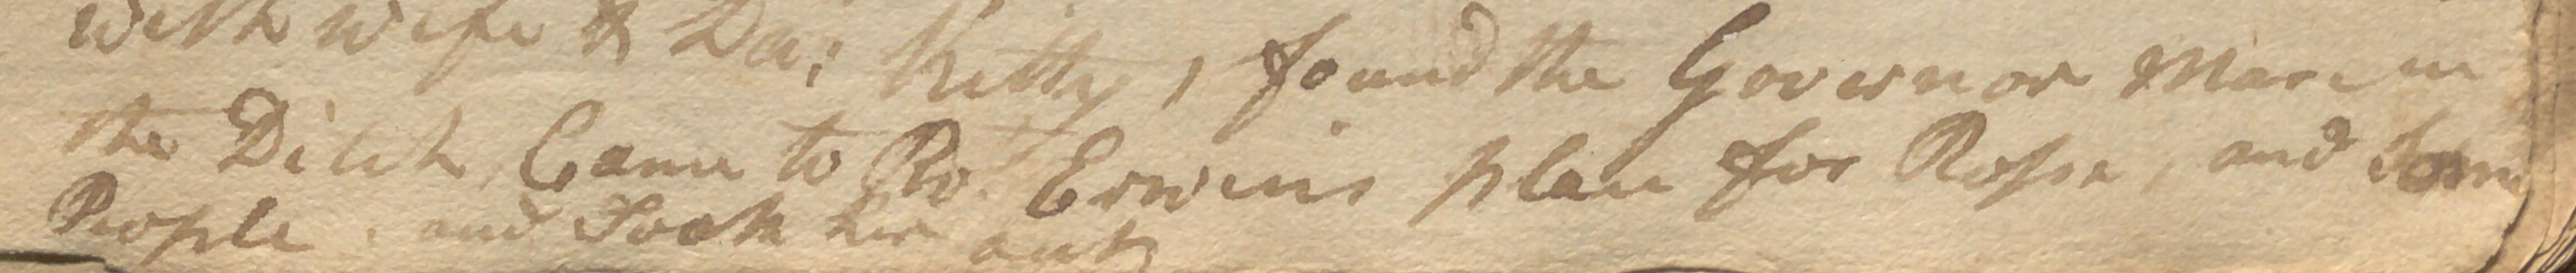the Ditch, Came to Ro^t. Erwins place for Roses, and Sam
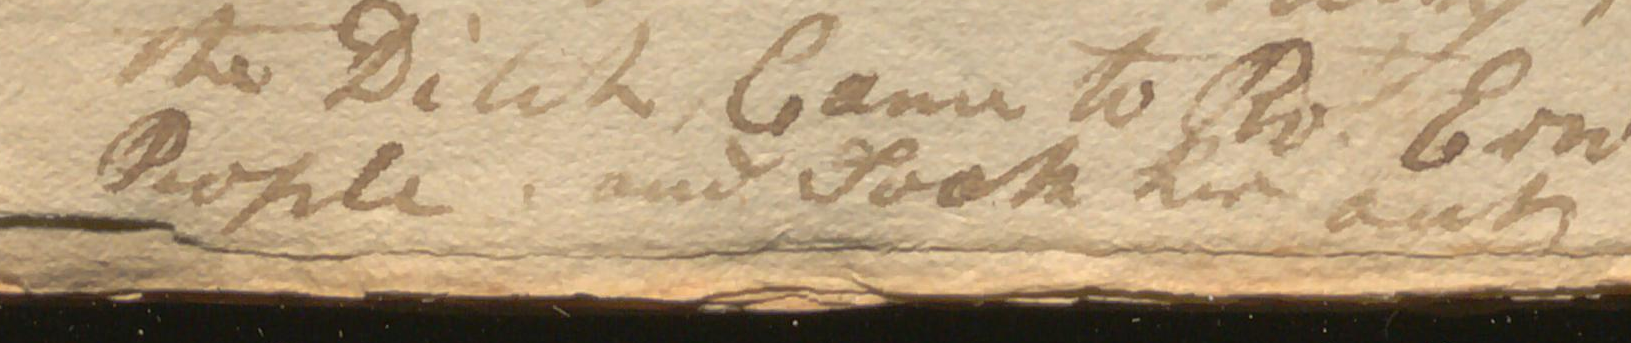People and Took her aout
